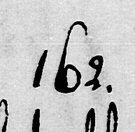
14.
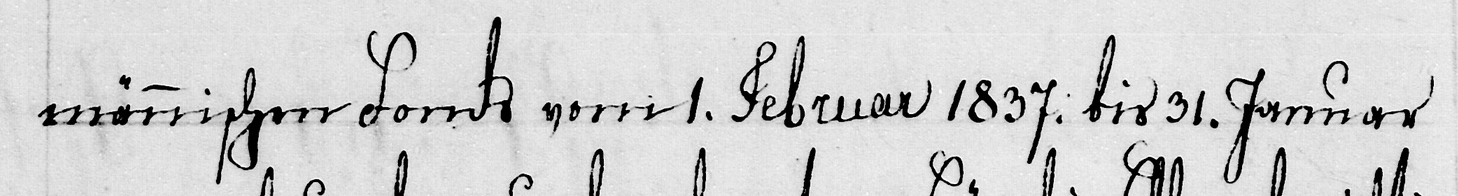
männischen Fonds vom 1. Februar 1837. bis 31. Januar
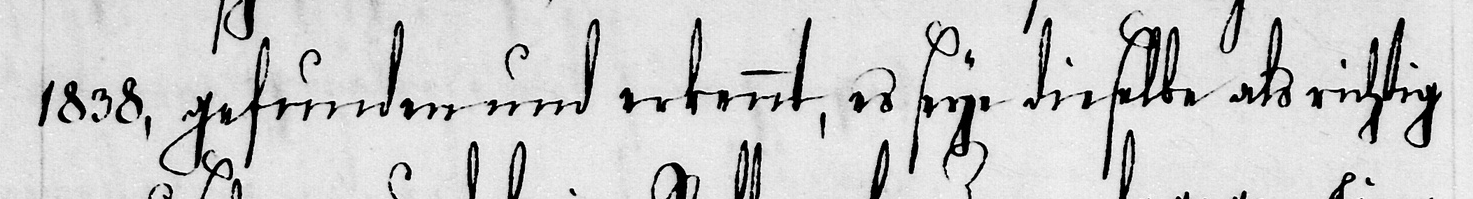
1838, gefunden und erkennt, es seye dieselbe als richt¬
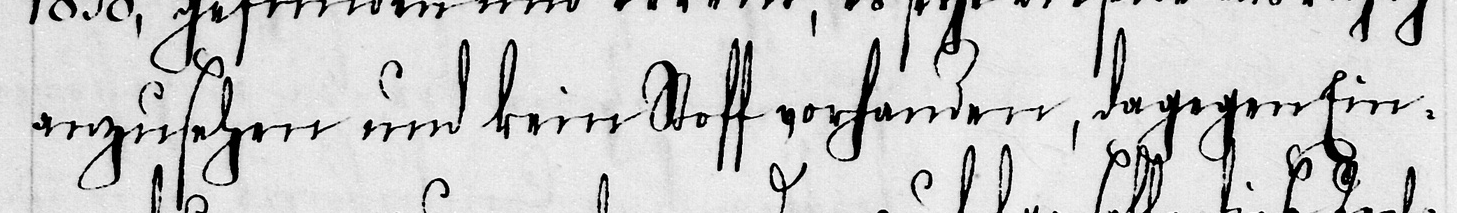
anzusehen und kein Stoff vorhanden, dagegen Ein¬
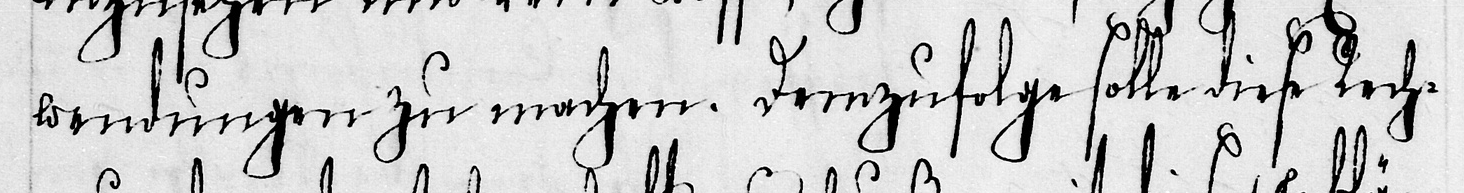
wendungen zu machen. Demzufolge solle diese Rech¬
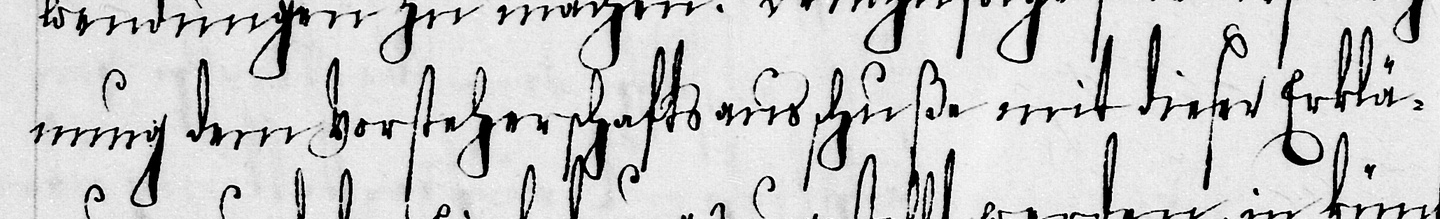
nung dem Vorsteherschaftsausschuße mit dieser Erklä¬
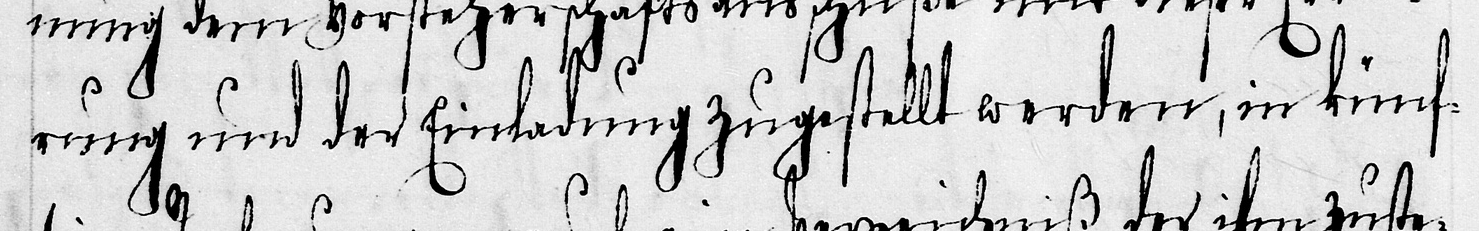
rung und der Einladung zugestellt werden, in künf¬
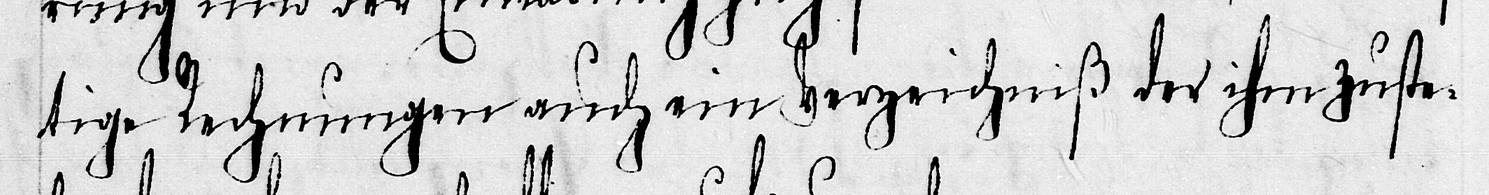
tiger Rechnungen auch ein Verzeichniß der ihm zuste¬
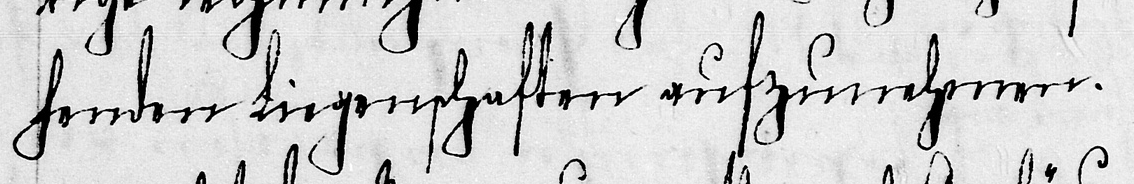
henden Liegenschaften aufzunehmen.
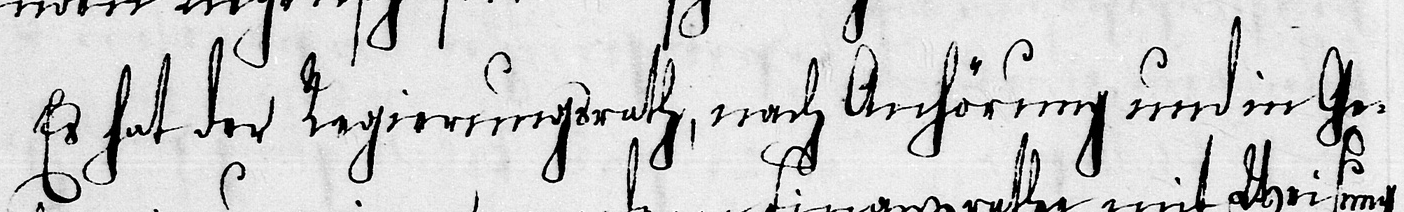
Es hat der Regierungsrath, nach Anhörung und in Ge¬
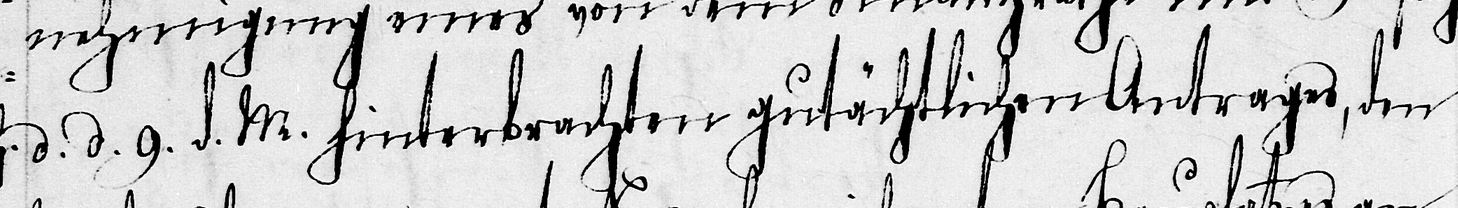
d. d. 9. d. M. hinterbrachten gutächtlichen Antrages, den
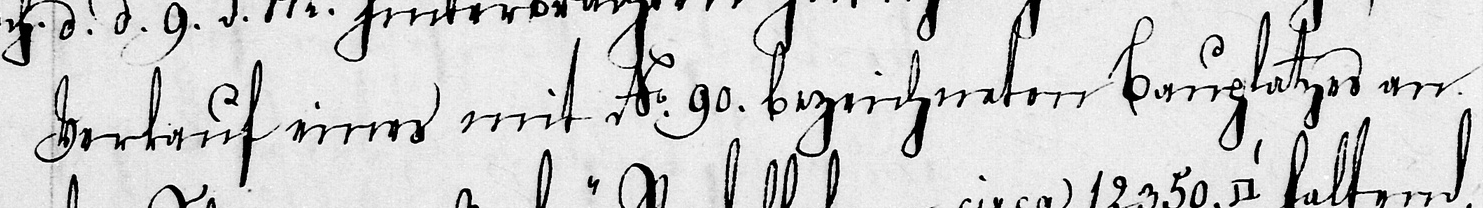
Verkauf eines mit No. 90. bezeichneten Bauplatzes an
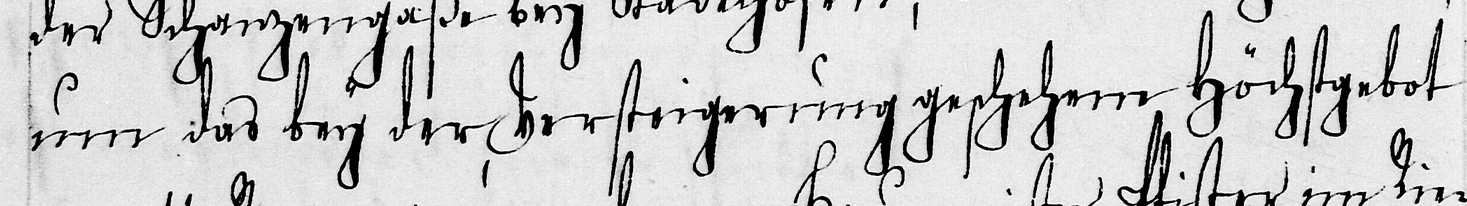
um das bey der Versteigerung geschehene Höchstgebot
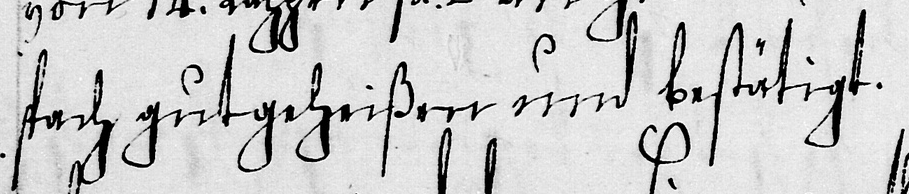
ach gutgeheißen und bestätigt.
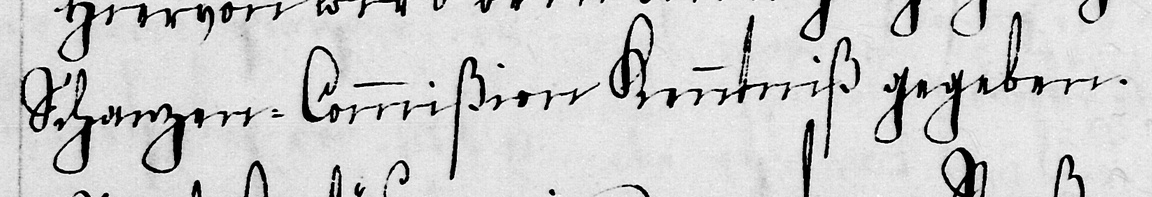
Schanzen-Commißion Kenntniß gegeben.
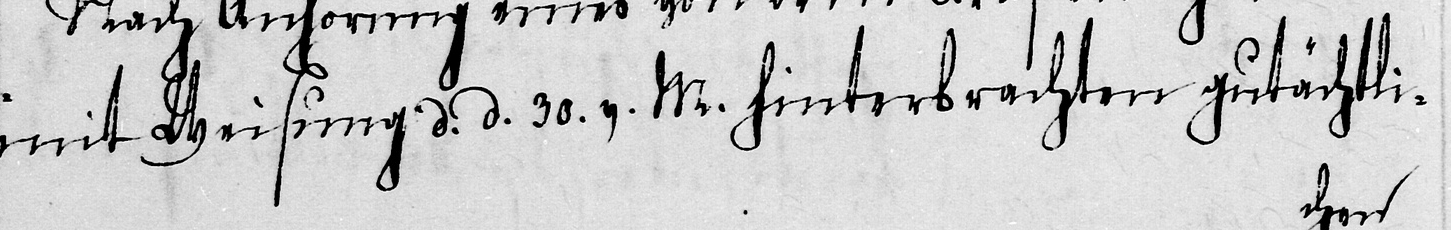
mit Weisung d. d. 30. v. M. hinterbrachten gutächtli-
